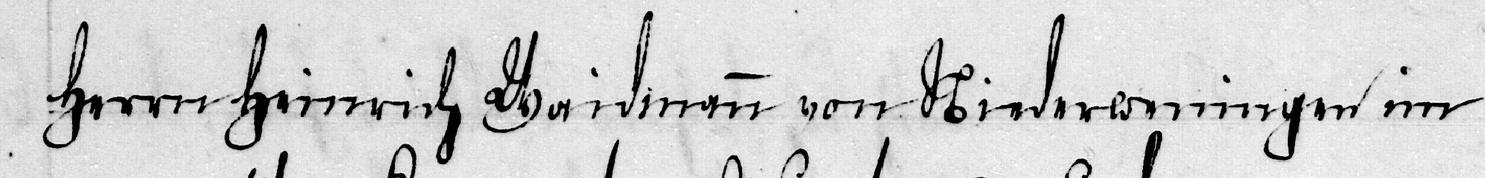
Herrn Heinrich Waidmann von Niederweningen im
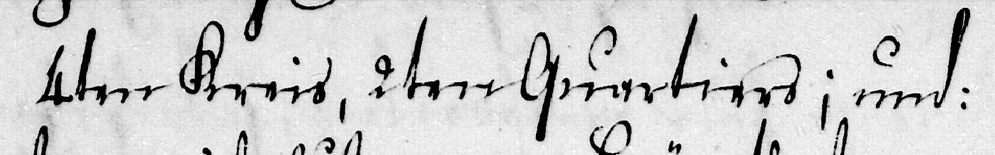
4ten Kreis, 2ten Quartiers; und:
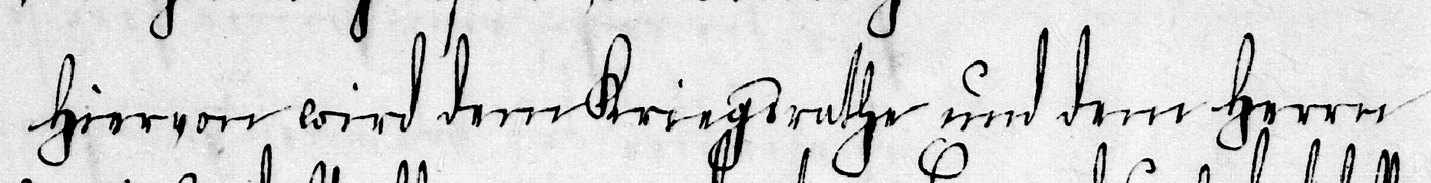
Hiervon wird dem Kriegsrathe und dem Herrn
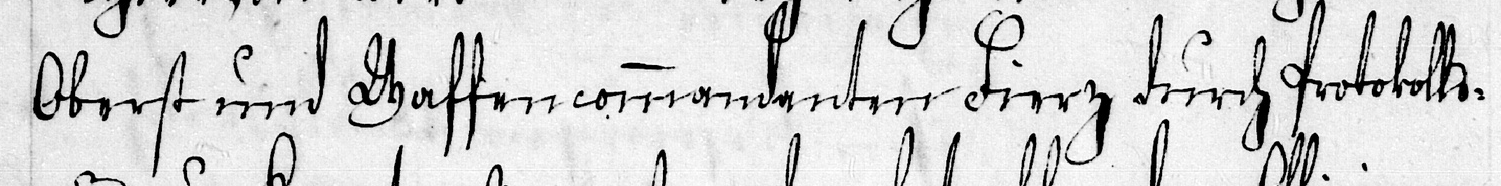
Oberst und Waffencommandanten Fierz durch Protokol¬
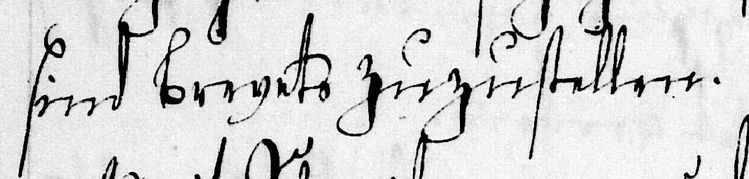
sind Brevets zuzustellen.
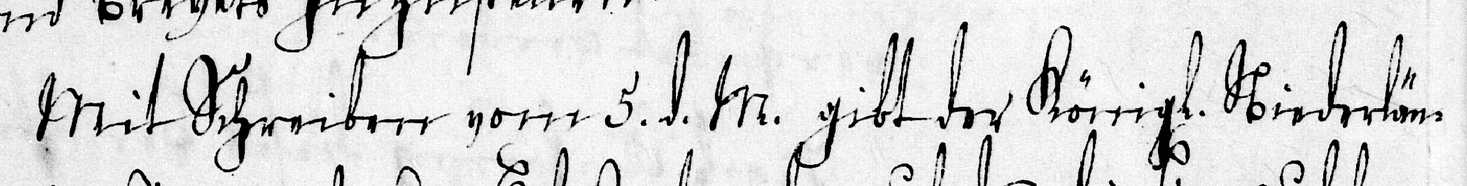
Mit Schreiben vom 5. d. M. gibt der Königl. Niederlän¬
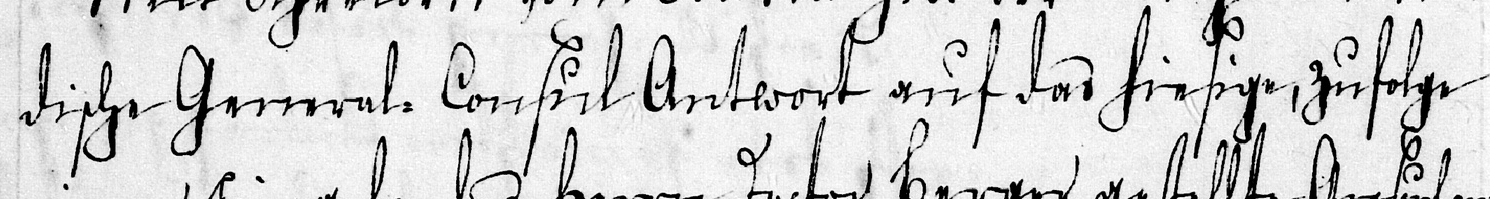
dische General-Consul Antwort auf das hiesige, zufolge
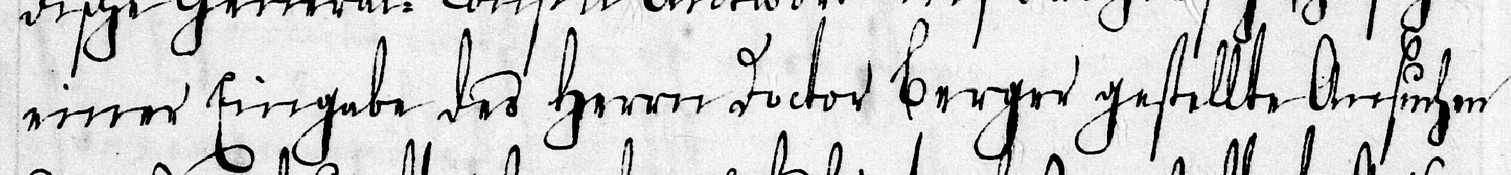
einer Eingabe des Herrn Doctor Berger gestellte Ansuchen
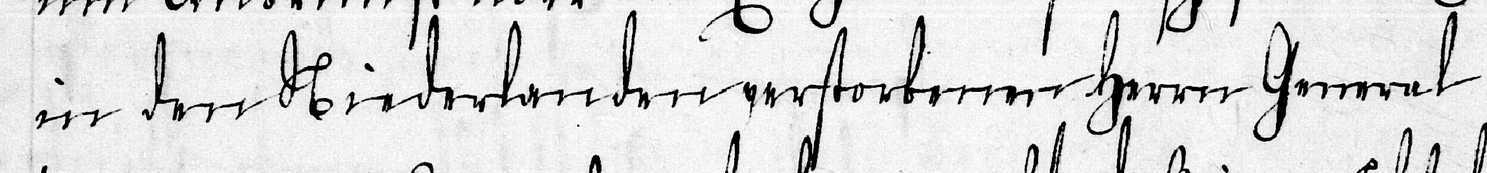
in den Niederlanden verstorbenen Herrn General
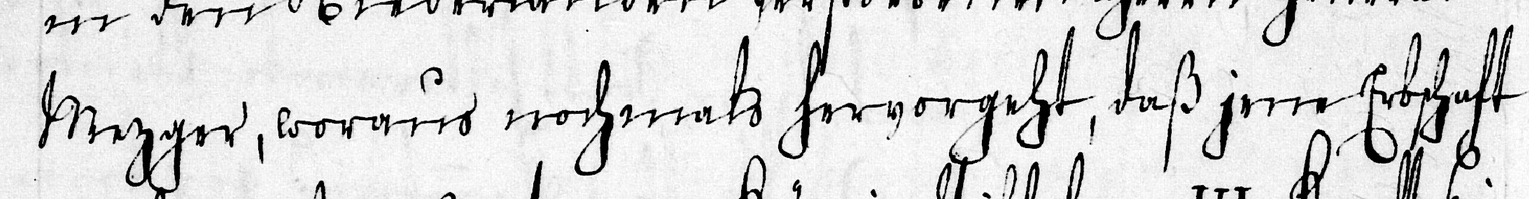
Mezger, woraus nochmals hervorgeht, daß jene Erbschaft
